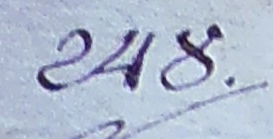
248.
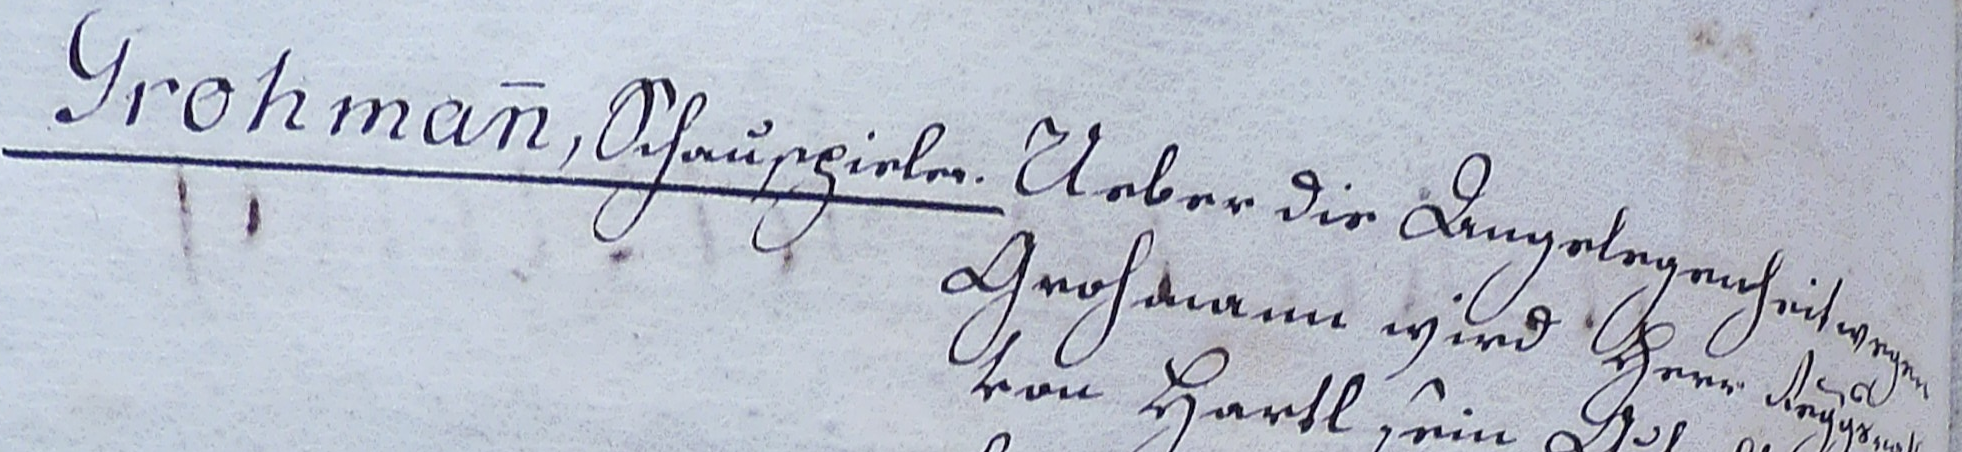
Grohman̅, Schauspieler. Ueber die Angelegenheit wegen
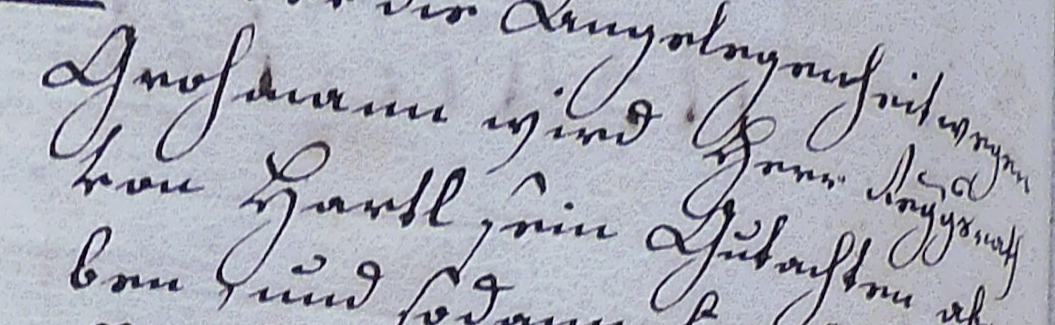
Grohmann wird Herr Reg͞gsrath
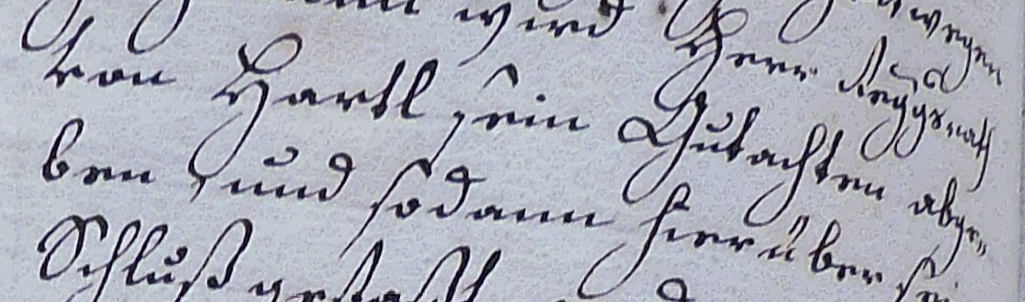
von Hartl sein Gutachten abge¬
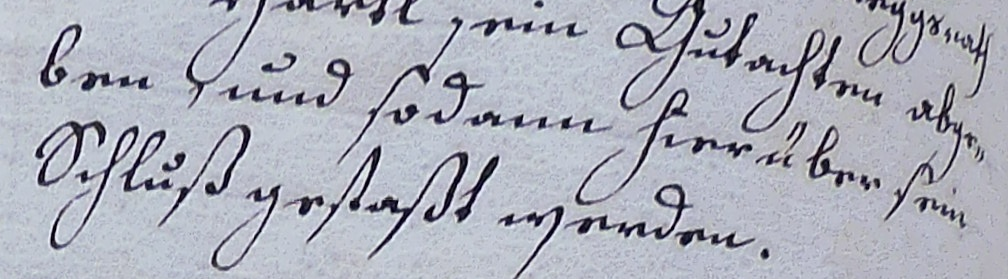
ben, und sodann hierüber sein
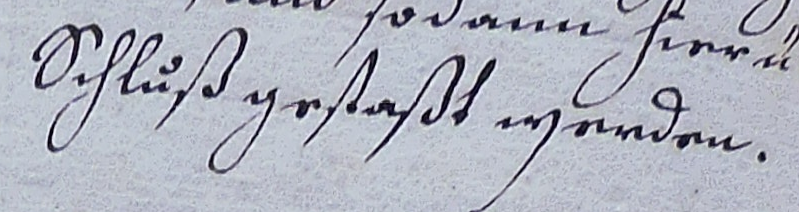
Schluß gefaßt werden.
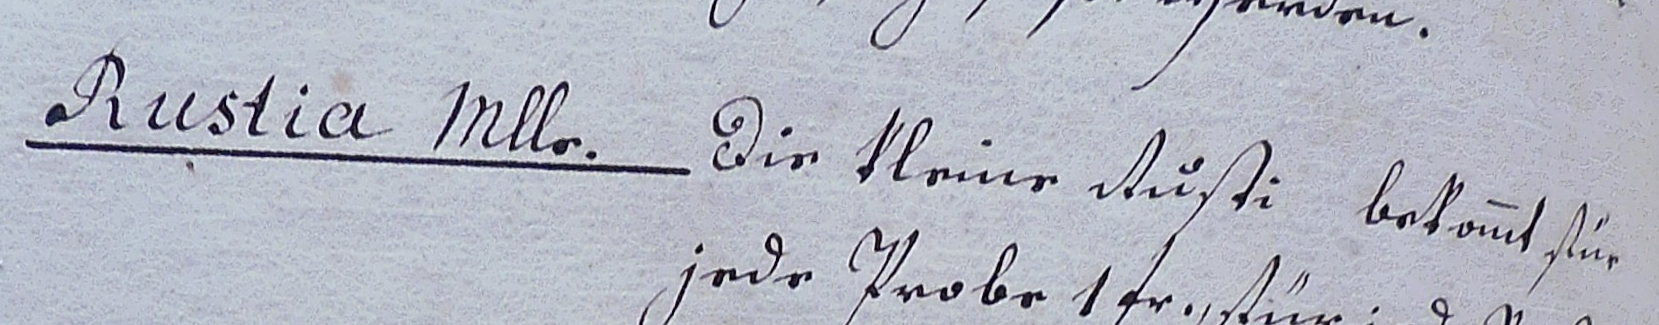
Rustia Mlle. Die kleine Rusti bekom̅t für
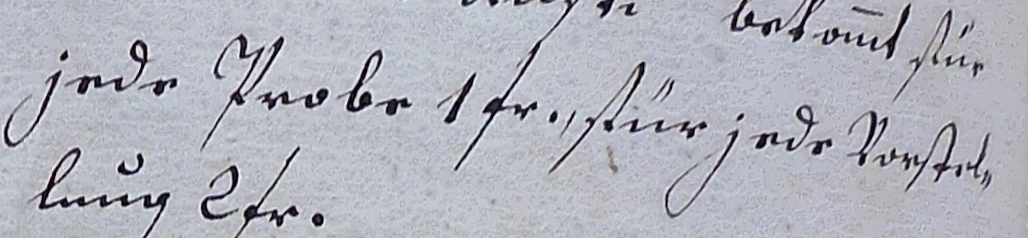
jede Probe 1fr., für jede Vorstel¬
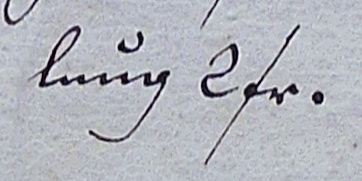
lung 2fr.
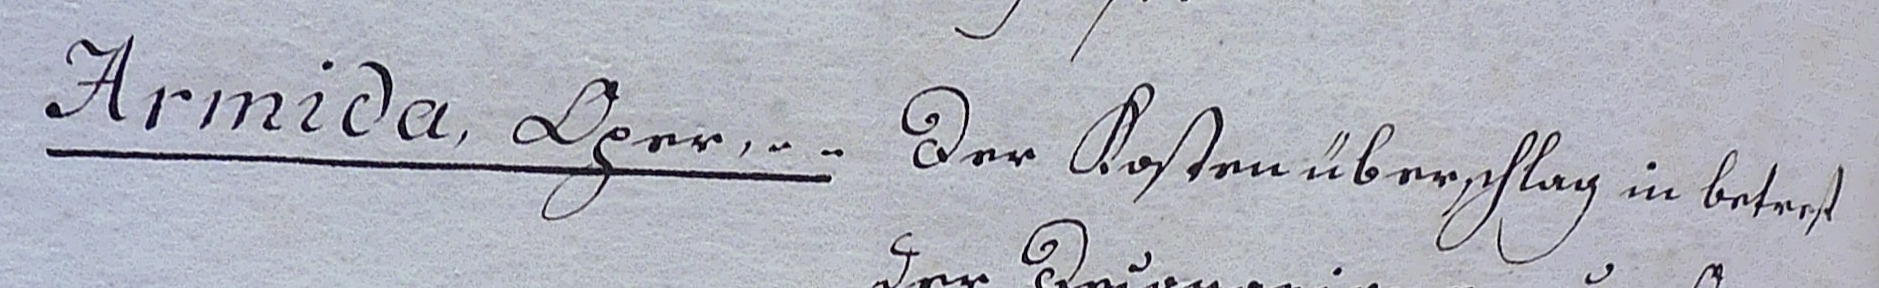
Armida, Oper, .. .. Der Kostenüberschlag in betref
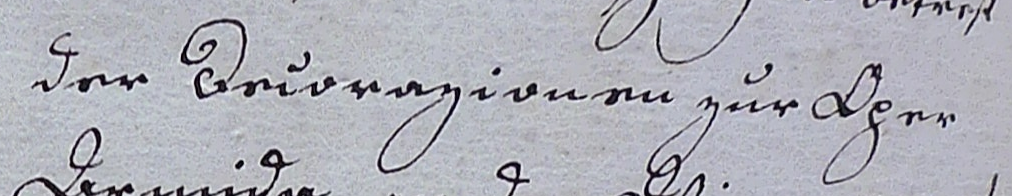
der Decorazionen zur Oper
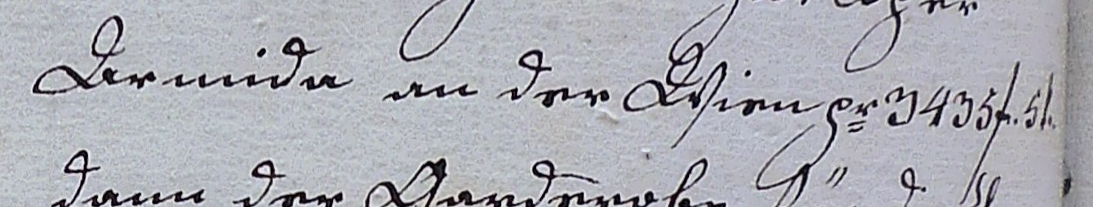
Armida an der Wien pr͇ 3435fr. 5kr.
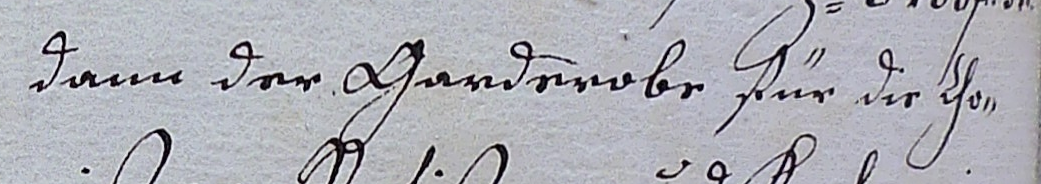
dann der Garderobe für die Cho¬
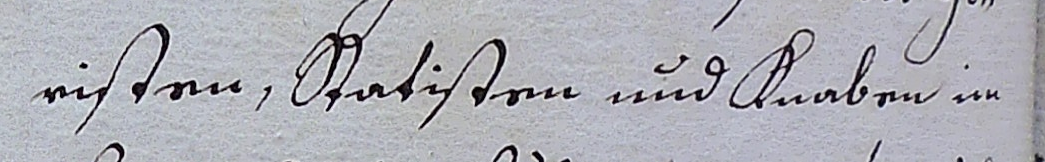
risten, Statisten und Knaben im
